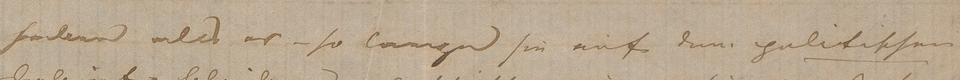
haben als er – so lange sie auf dem politischen
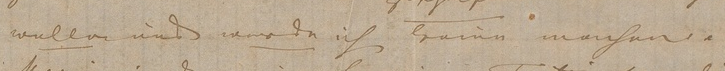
wolle und werde ich keine machen. –
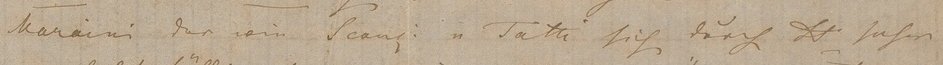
Maraini der wie Scanzi u Tatti sich durch St sehr
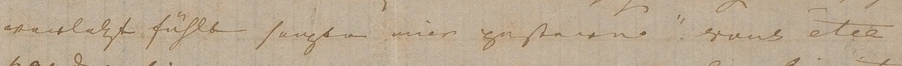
verletzt fühlt sagte mir gestern: «vous êtes
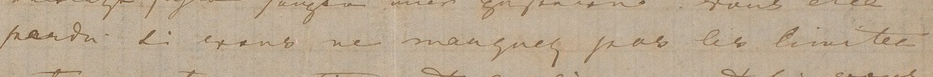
perdu si vous ne manquez pas les limites
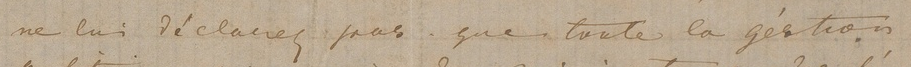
ne lui déclarez pas – que toute la géstion
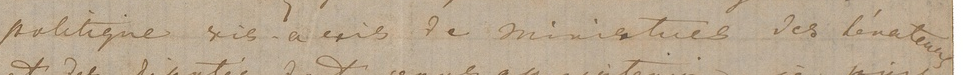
politique vis-a vis de Ministres des Sénateurs
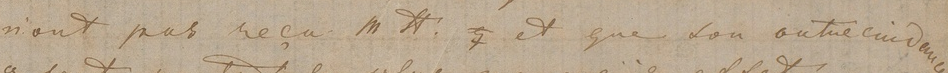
n'ont pas recu M St. et que son outrecuidance
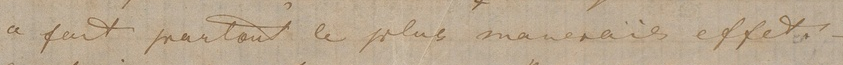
a fait partout le plus mauvais effet. –»
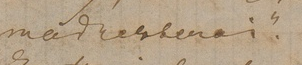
madresserai». –
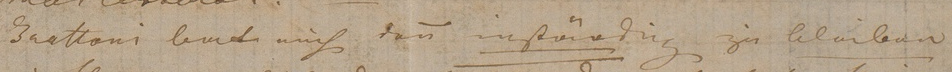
Grattoni bat mich dann inständig zu bleiben
